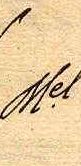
M.el
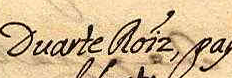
Duarte Roīz, pay.
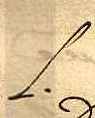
L.
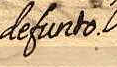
defunto.
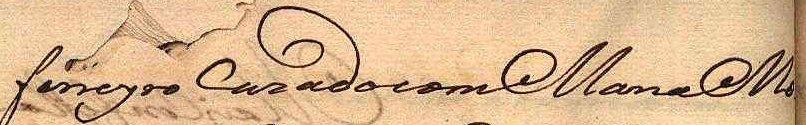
janeyro Cazado com Maria Mo
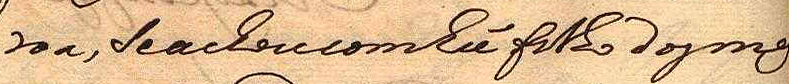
roa, se achou com hū filho dos mes
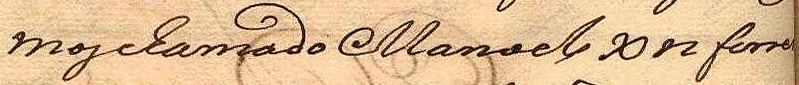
mos chamado Manoel xn ferrei
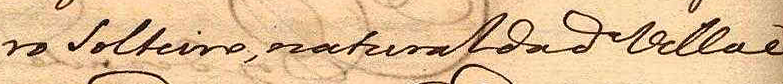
ro solteiro, natural da da villa e
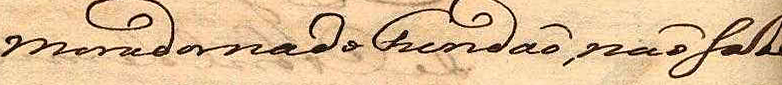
morador na do Fundaõ, naõ sabe
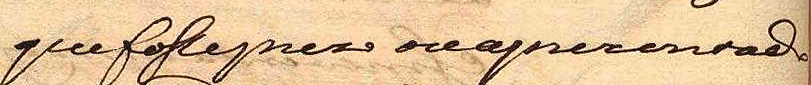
que fosse prezo ou aprezentado
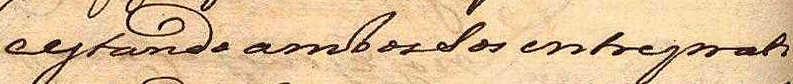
e estando amboz sos entre prati
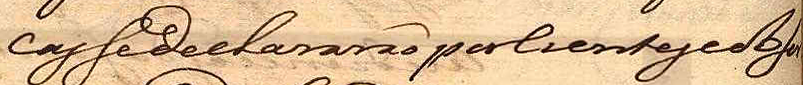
cas se declararaõ por Crentes e obser
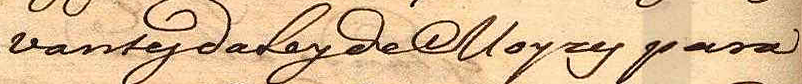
vantes da Ley de Moyzes para
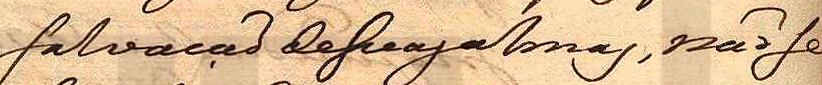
salvaçaõ de suas almas, naõ se
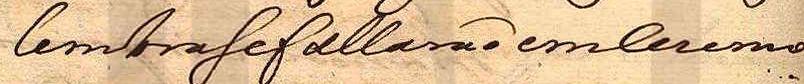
lembra se fallaraõ em Ceremo
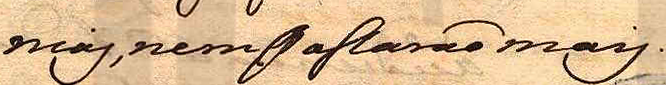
nias, nem passaraõ mais.
